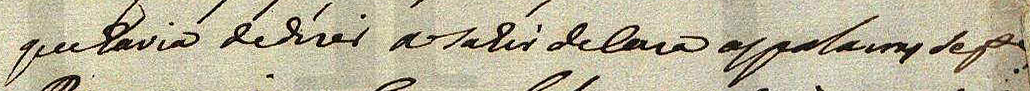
que havia de dizer ao sahir de Caza as palavras segte
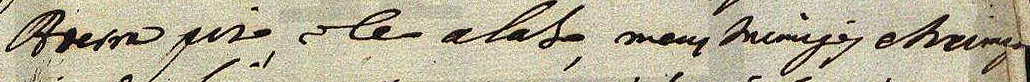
A terra pizo, o Ceo alabo, meus Inimigos e Inimig
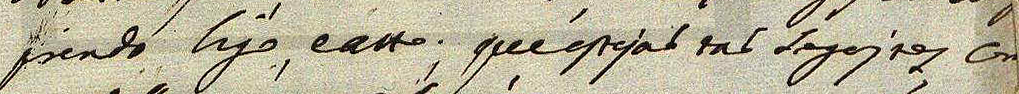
prendo ligo, e atto; que estejaõ taõ sogejtos com
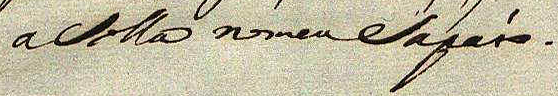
a Solla no meu Sapato.
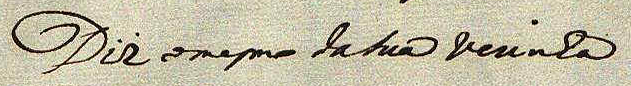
Diz o mesmo da sua vezinha
